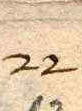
22
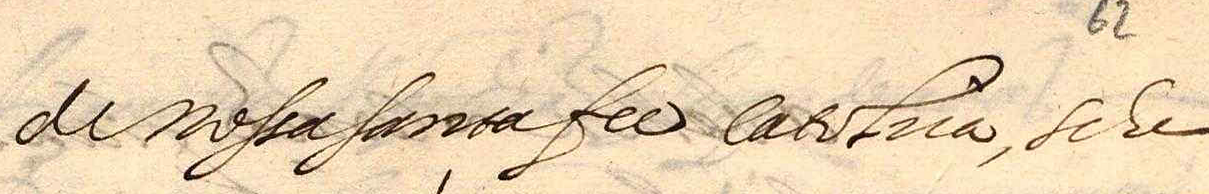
de nossa santa fee catolica, se he
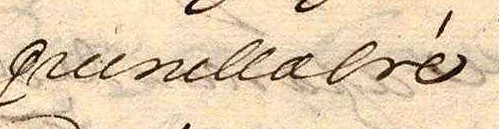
que nella cre
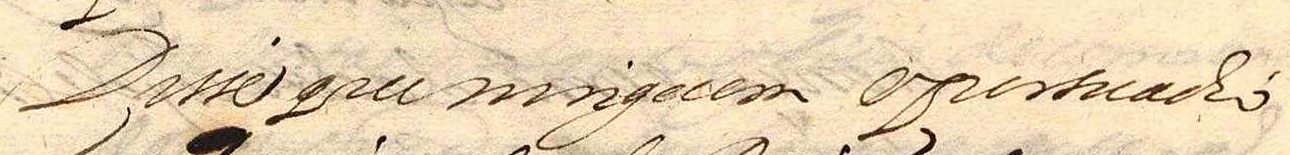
Disse que niguem o persuadio
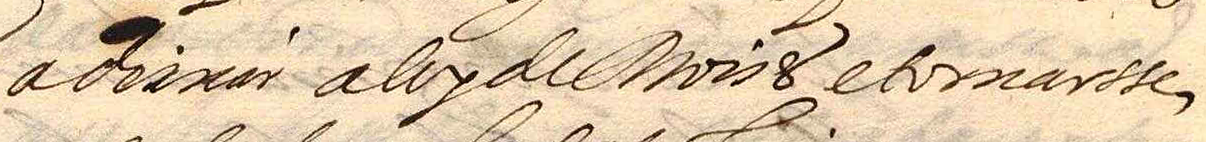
a deixar a ley de Moises e tornarsse
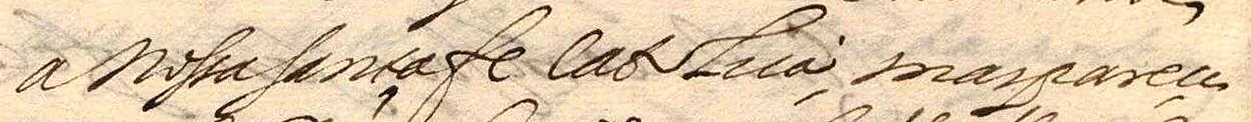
a nossa santa fe catolica, mas parece
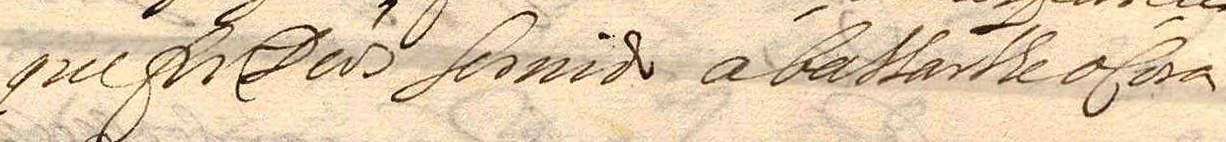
que foi Deos seruido aballarlhe o Cora
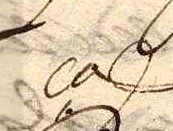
çaõ
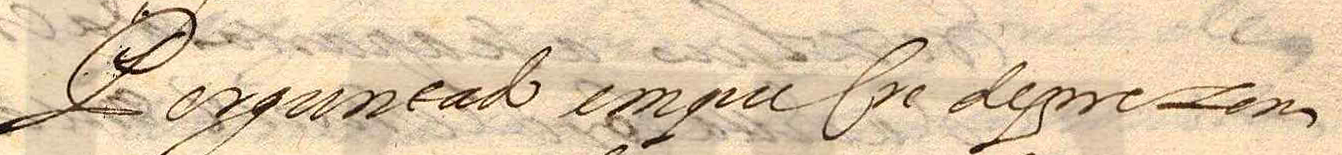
Perguntado em que Cre de prezen
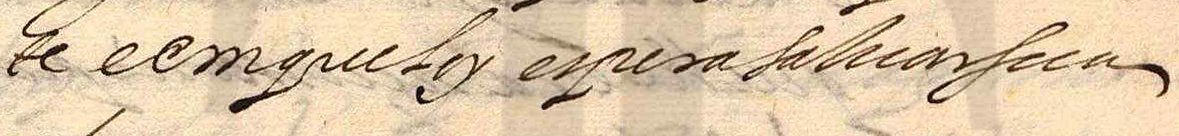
te e em que Ley espera saluar sua
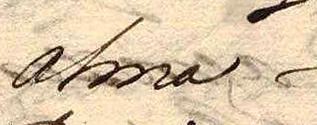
alma
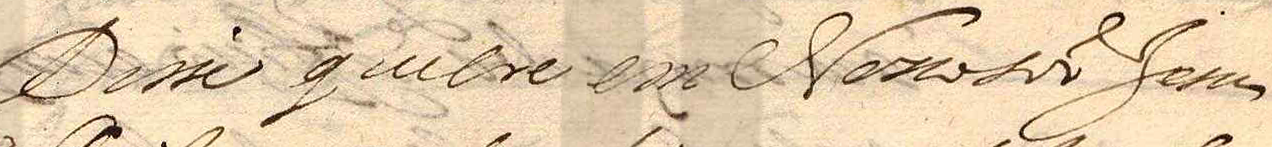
Disse que cre em Nosso sor̄ Jesu
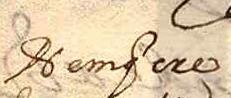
Ds em q̄ cre
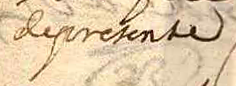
de presente
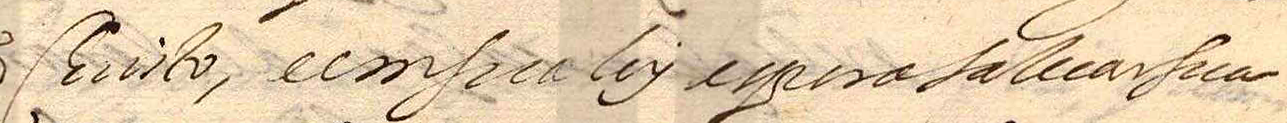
Christo, e em sua ley espera saluar sua
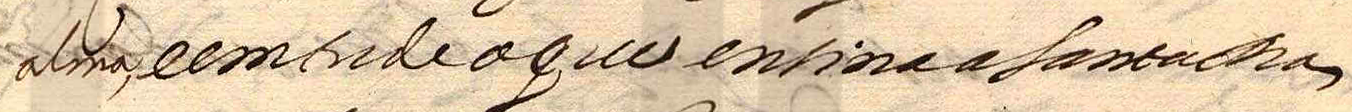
alma, e em tudo o que ensina a Santa Ma
